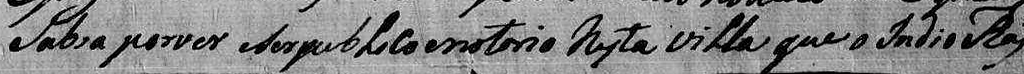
sabia por ver e ser publico e notorio nesta villa que o Indio Raj
